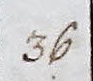36
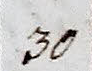30
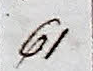61
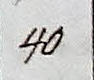40
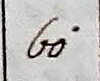60
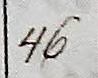46
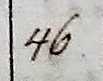46
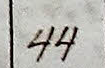44
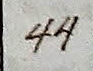44
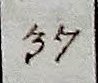37
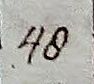48
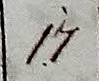17
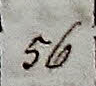56
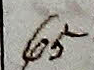65
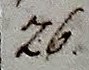26
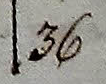36
